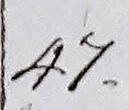47
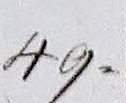49
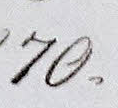70
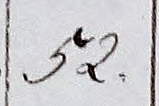52.
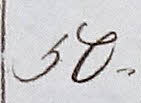50
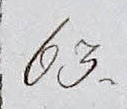63
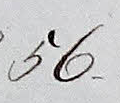56
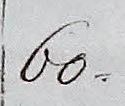60
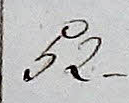52
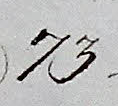73
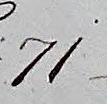71
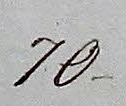70
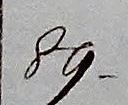89
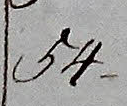54
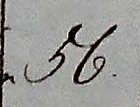56
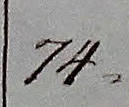74
